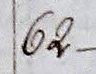62
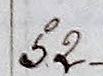52
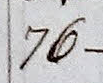76
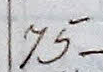75
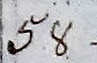58
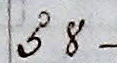58
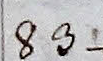83
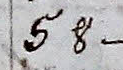58
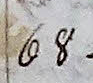68
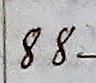88
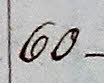60
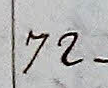72
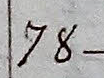78
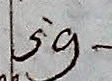59
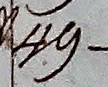49
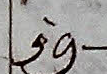59
